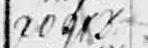20913
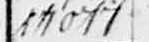57077
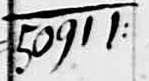50911
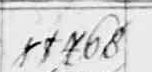11468
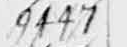9447
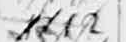1212
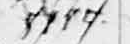5755
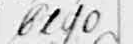6110
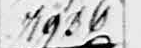7936
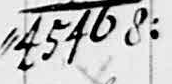45468
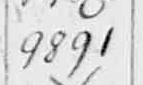9891
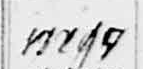13295
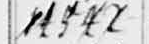14542
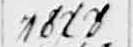7823
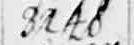3248
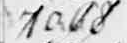7068
